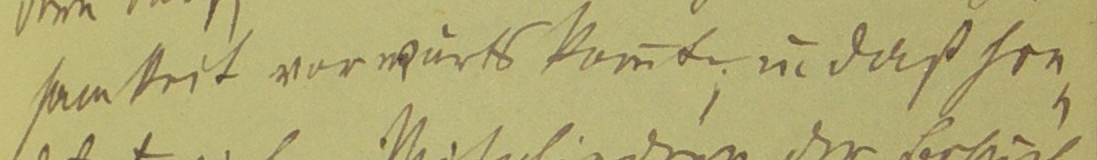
samkeit vorwärts kommt, und daß so¬
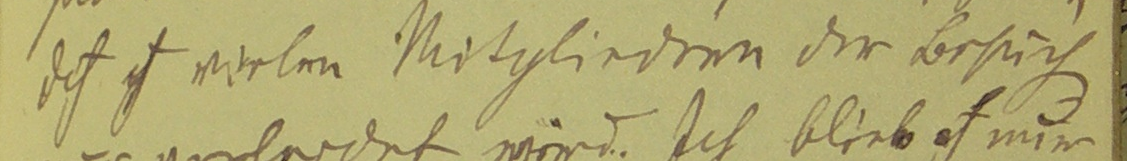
mit auch vielen Mitglieder der Besuch
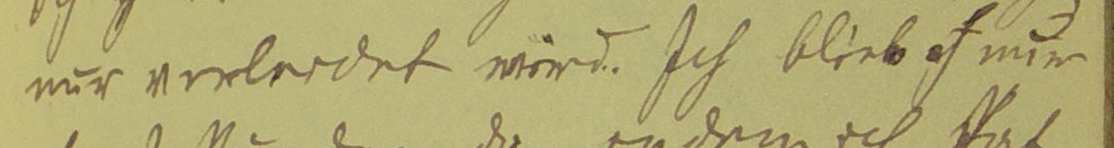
nur verleidet wird. Ich blieb auch nur
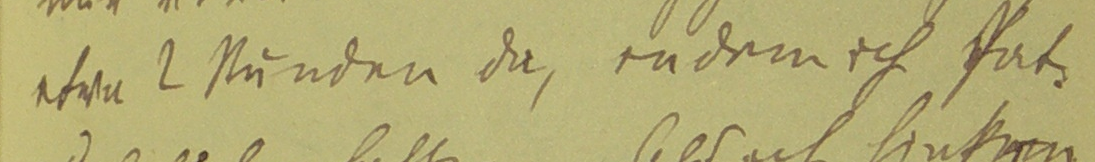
etwa 2 Stunden da, indem ich Patienten
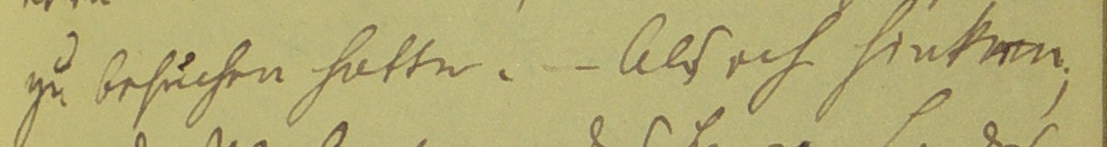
zu besuchen hatte.—Als ich hinkam
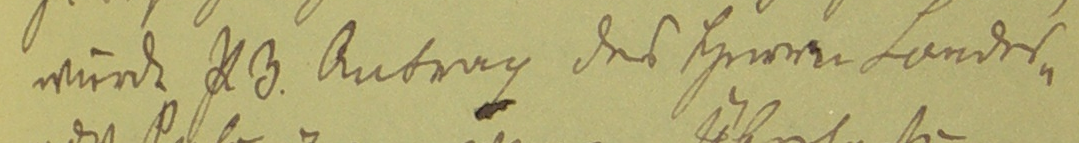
wurde P3. Antrag des Herren Landes-
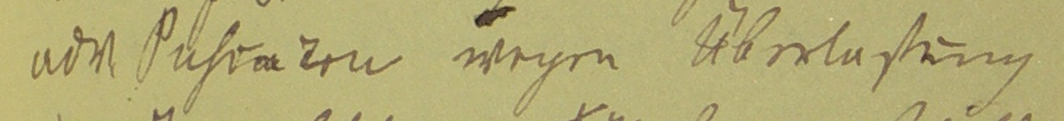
adv. Puhiatu wegen Überlaßung
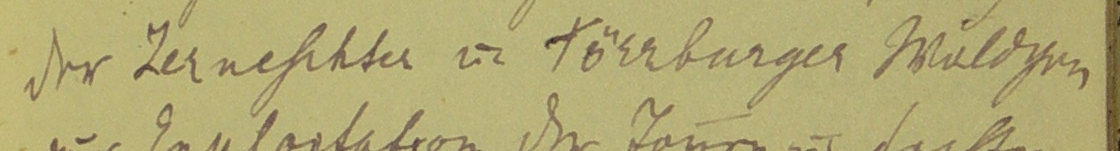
der Zernechter und Törzburger Wäldchen
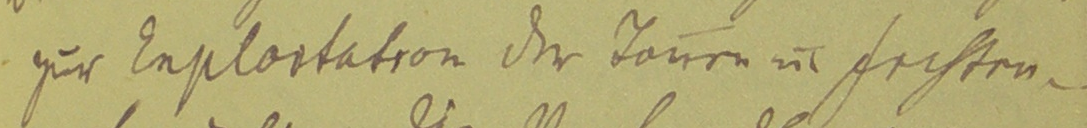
zur Exploitation der Tannen und Fichten
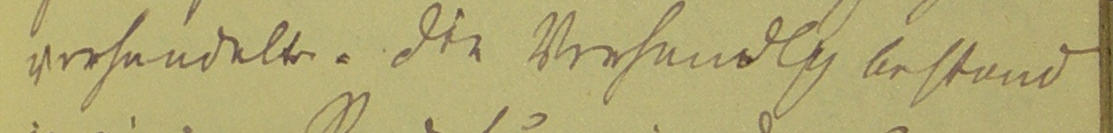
verhandelt. Die Verhandlung bestand
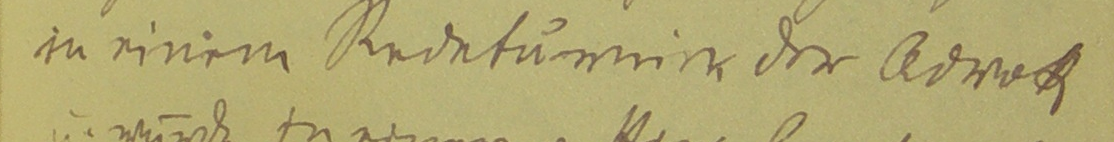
in einem Redetournier der Advokaten
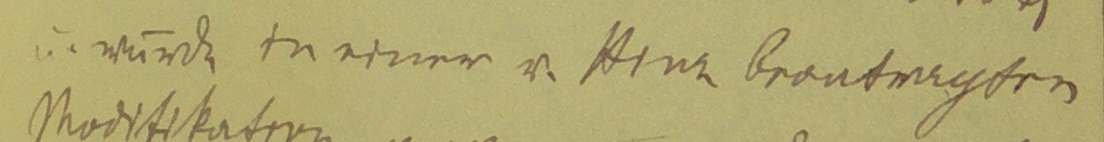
und wurde in einer von Hinz beantragten
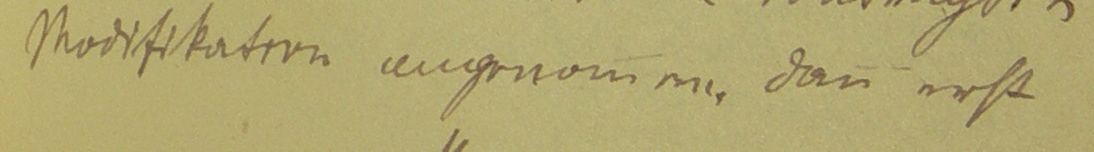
Modifikation angenommen. Dann erst
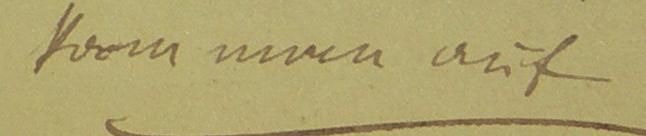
kam man auf
